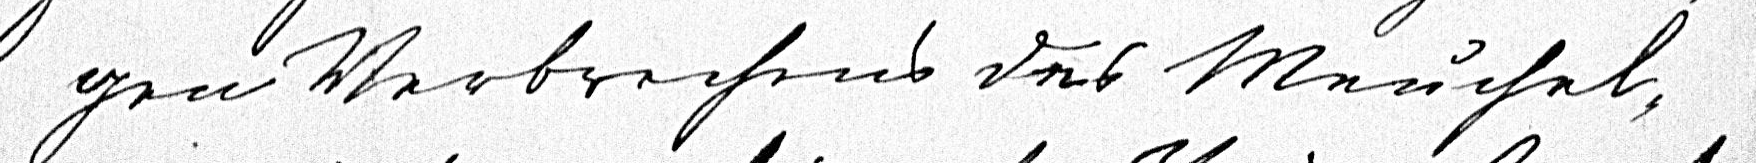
gen Verbrechens des Meuchel¬
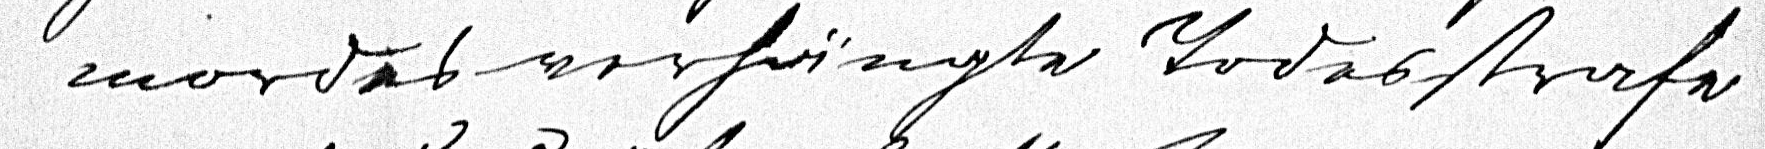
mordes verhängte Todesstrafe
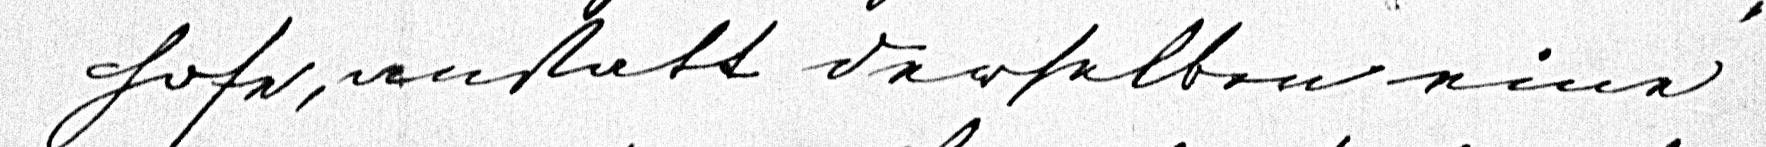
hofe, anstatt derselben eine
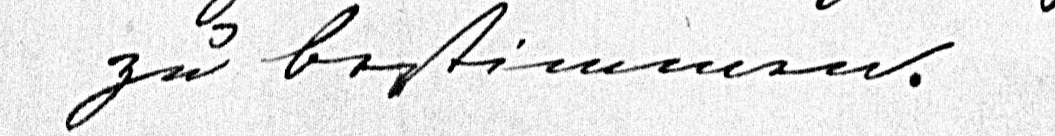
zu bestimmen.
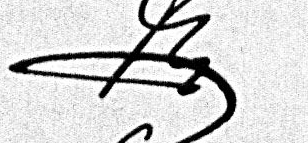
xx
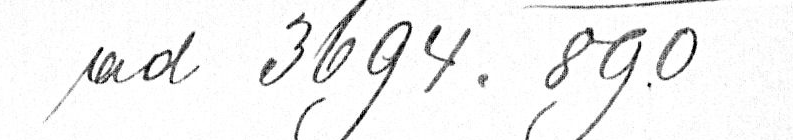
ad 3694. 890
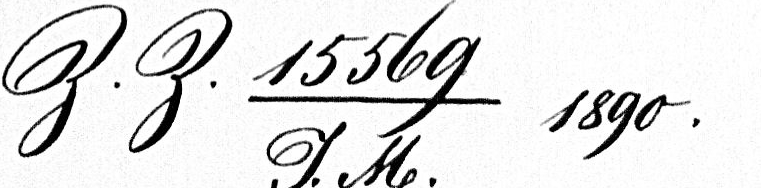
Z.Z. 15569/ 1890.
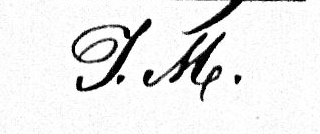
J.M.
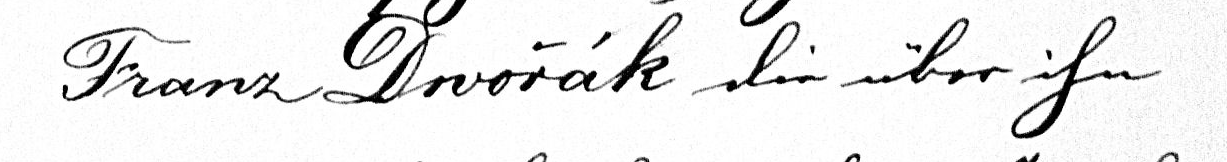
Franz Dwořác die über ihn
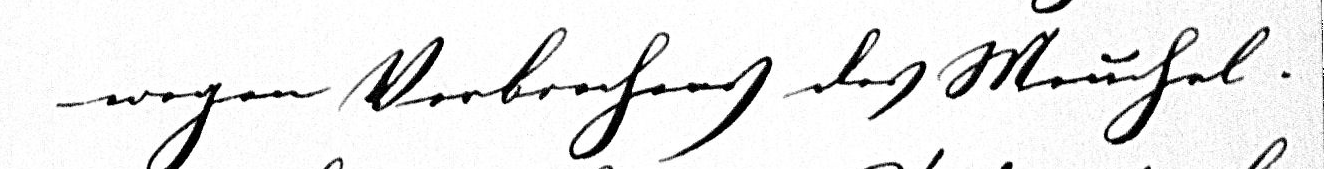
wegen Verbrechens des Meuchel¬
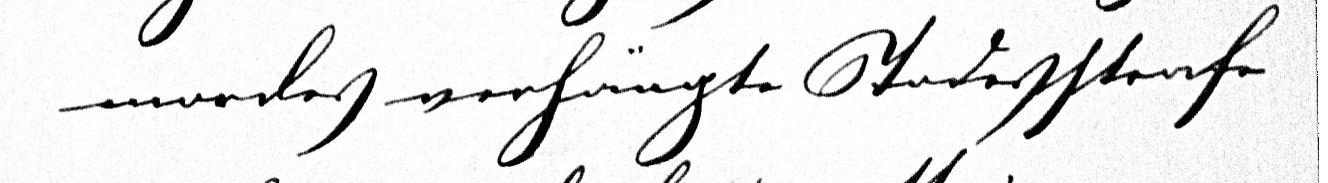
mordes verhängte Todesstrafe
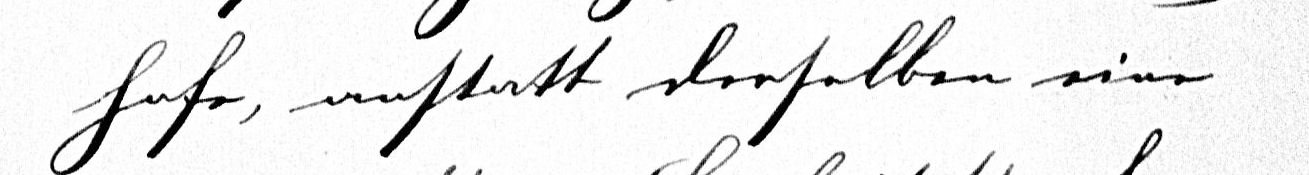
hofe, anstatt derselbe eine
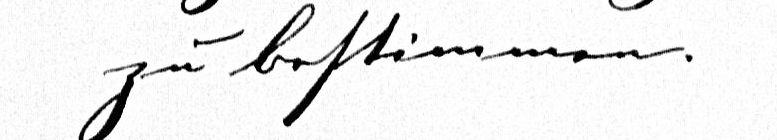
zu bestimmen.
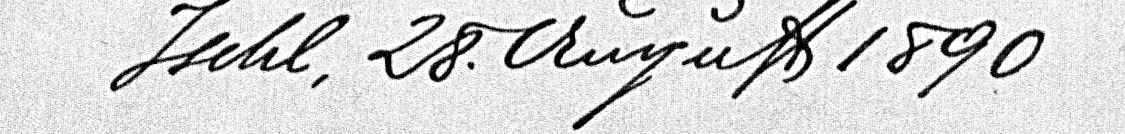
Ischl, 28. August 1890
